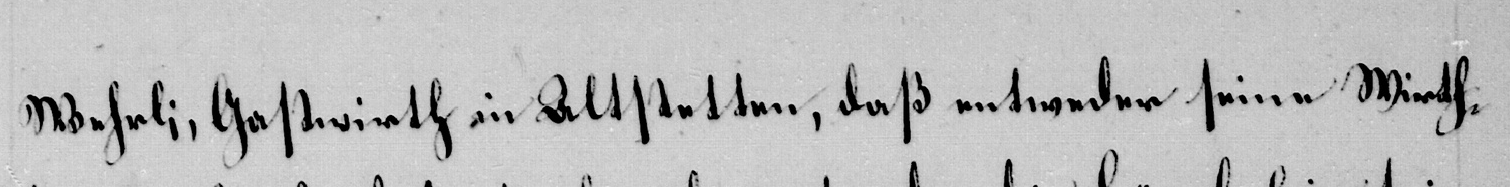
Wehrli, Gastwirth in Altstetten, daß entweder seine Wirth¬
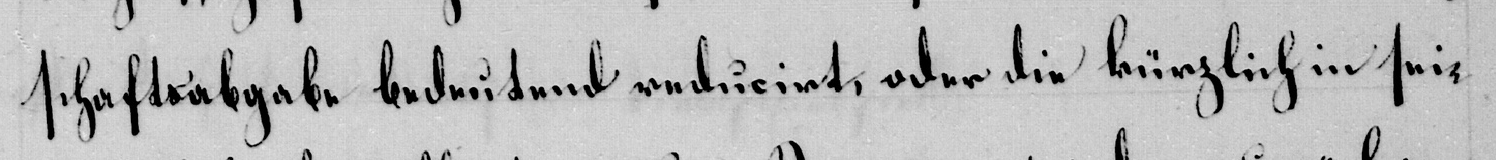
schaftsabgabe bedeutend reducirt oder die kürzlich in sei¬
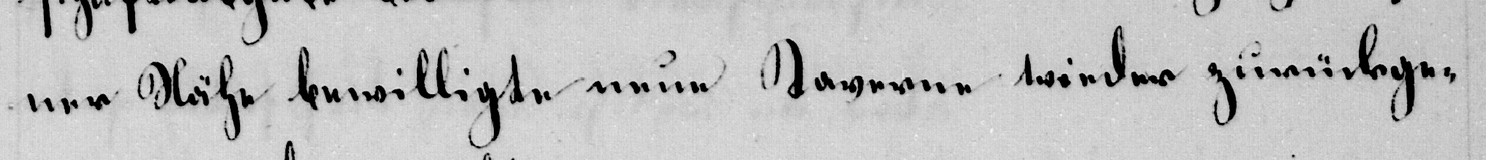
ner Nähe bewilligte neue Taverne wieder zurückge¬
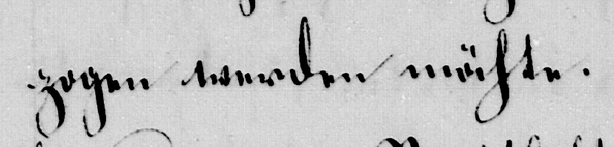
zogen werden möchte.
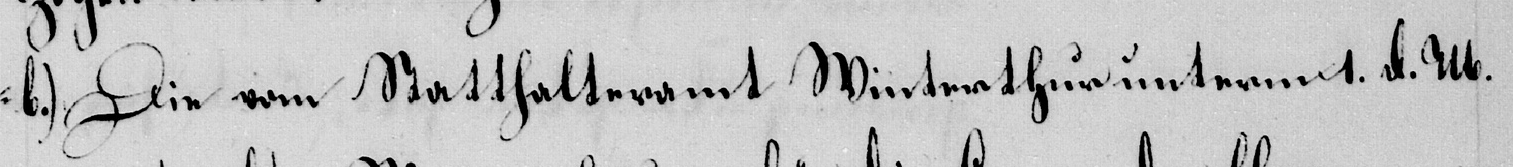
b.) Die vom Statthalteramt Winterthur unterm 1. d. M.
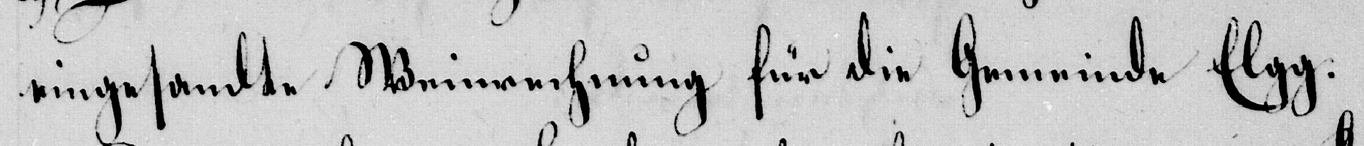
eingesandte Weinrechnung für die Gemeinde Elgg.
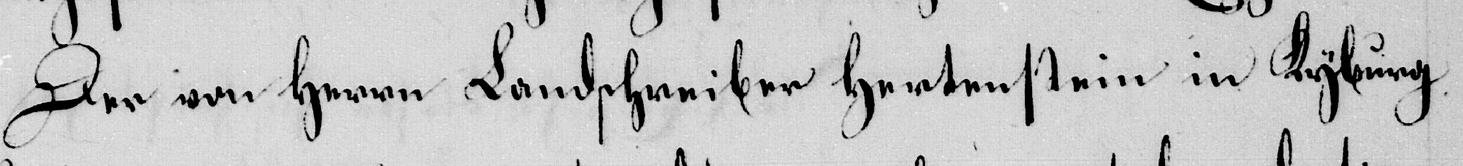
Der von Herrn Landschreiber Hertenstein in Kyburg
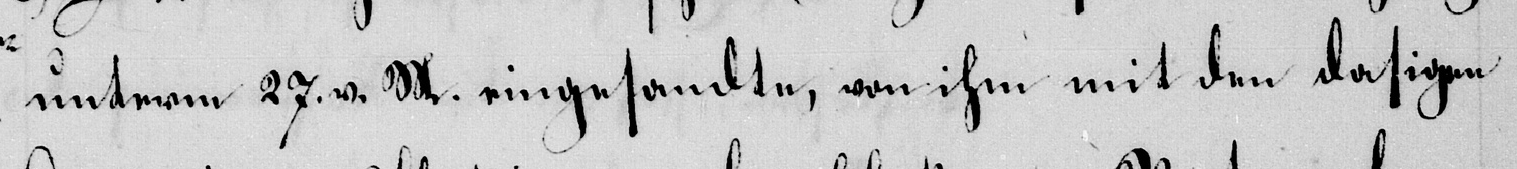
unterm 27. v. M. eingesandte, von ihm mit den dasigen
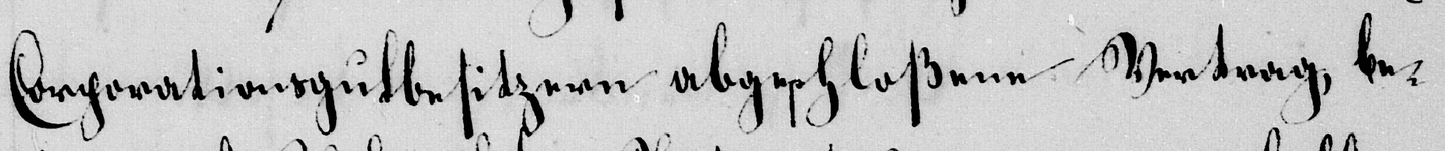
Corporationsgutbesitzern abgeschloßene Vertrag, be¬
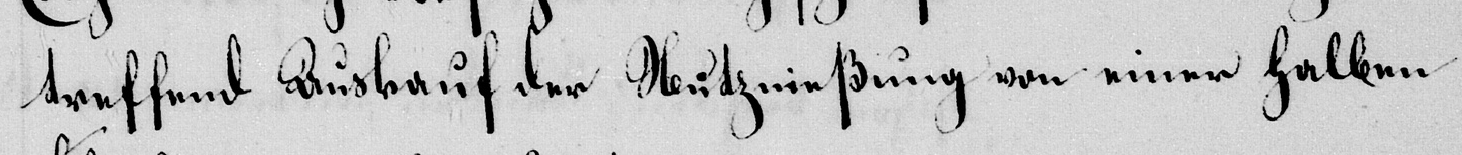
treffend Auskauf der Nutznießung von einer halben
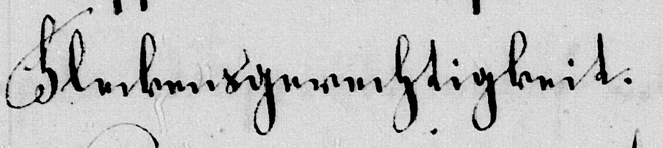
Fleckensgerechtigkeit.
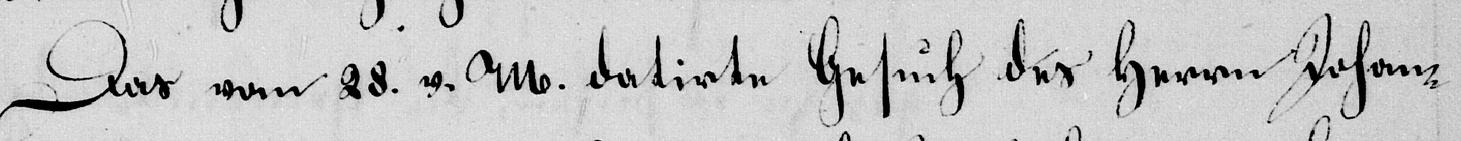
Das vom 28. v. M. datirte Gesuch des Herrn Johan¬
